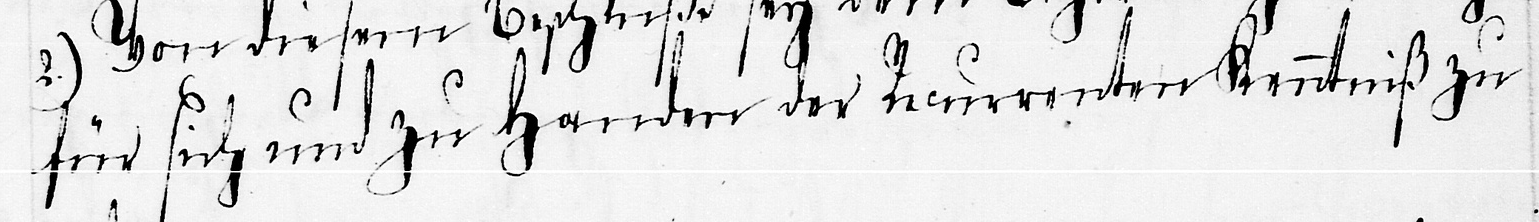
für sich und zu Handen der Recurrenten Kenntniß zu
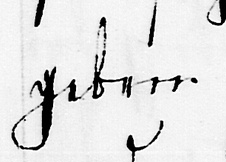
geben.
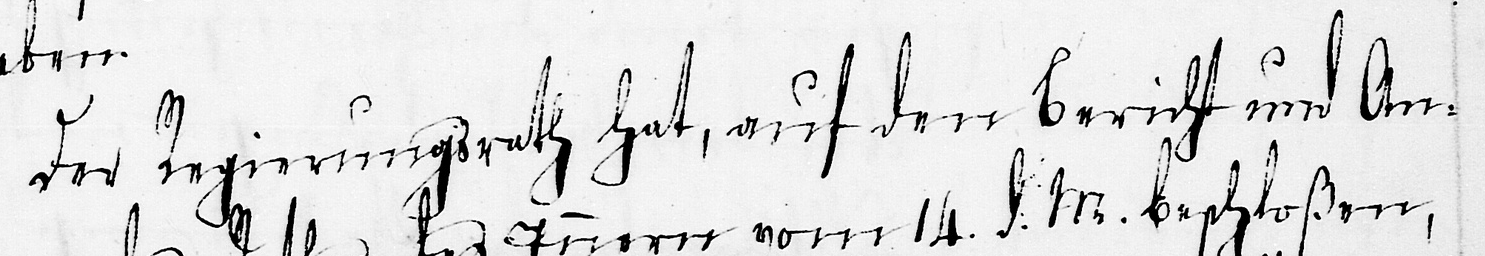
Der Regierungsrath hat, auf den Bericht und An¬
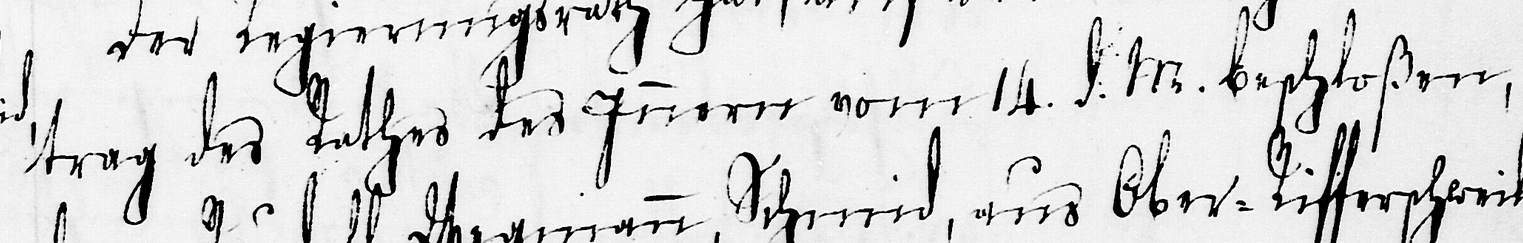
trag des Rathes des Innern vom 14. d. M. beschloßen,
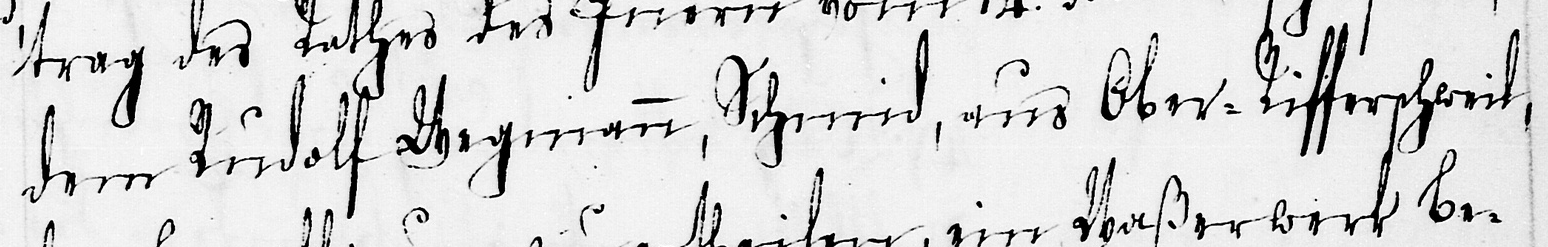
dem Rudolf Wegmann, Schmid, aus Ober-Rifferschwei¬
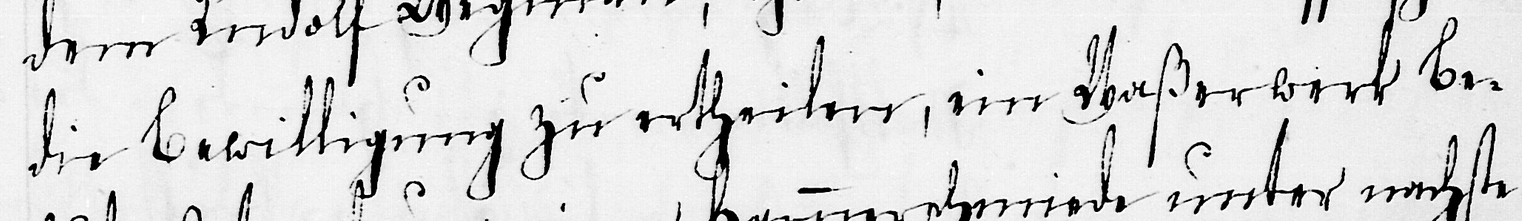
die Bewilligung zu ertheilen, ein Waßerwerk Be¬
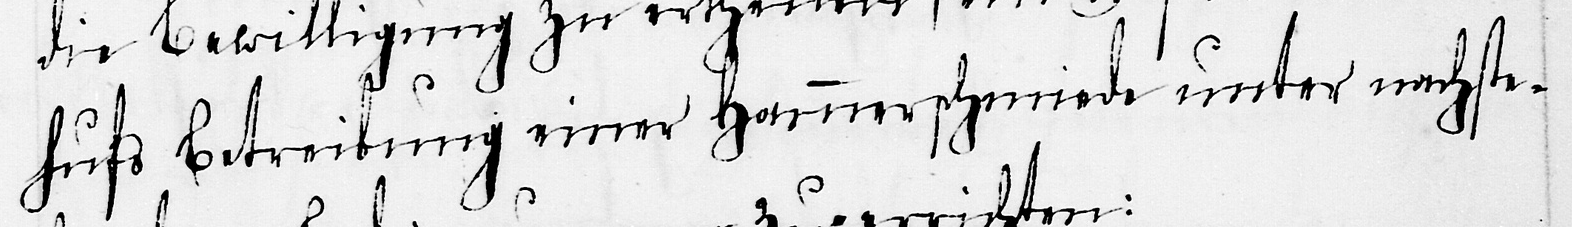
hufs Betreibung einer Hammerschmiede unter nachste¬
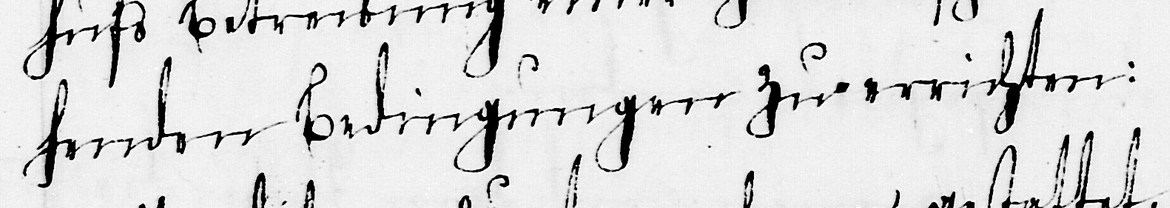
henden Bedingungen zu errichten:
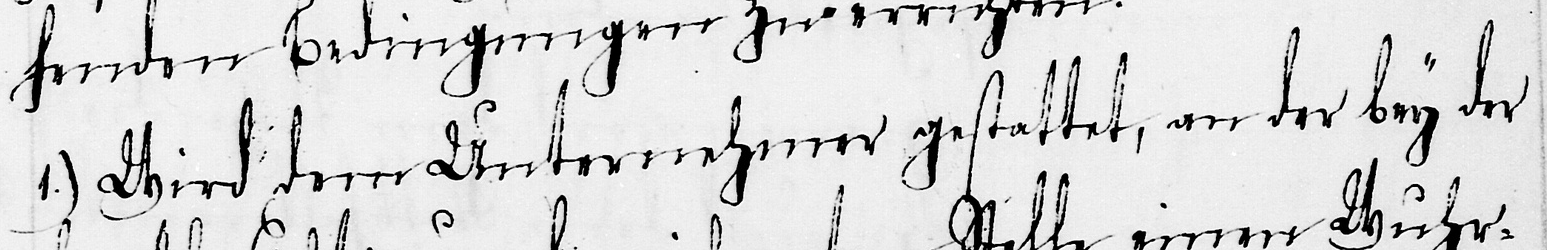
1.) Wird dem Unternehmer gestattet, an der bey der
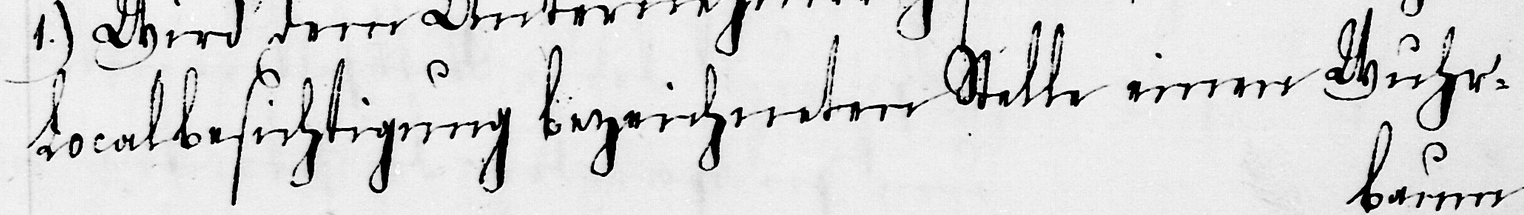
Localbesichtigung bezeichneten Stelle einen Wuhr-
